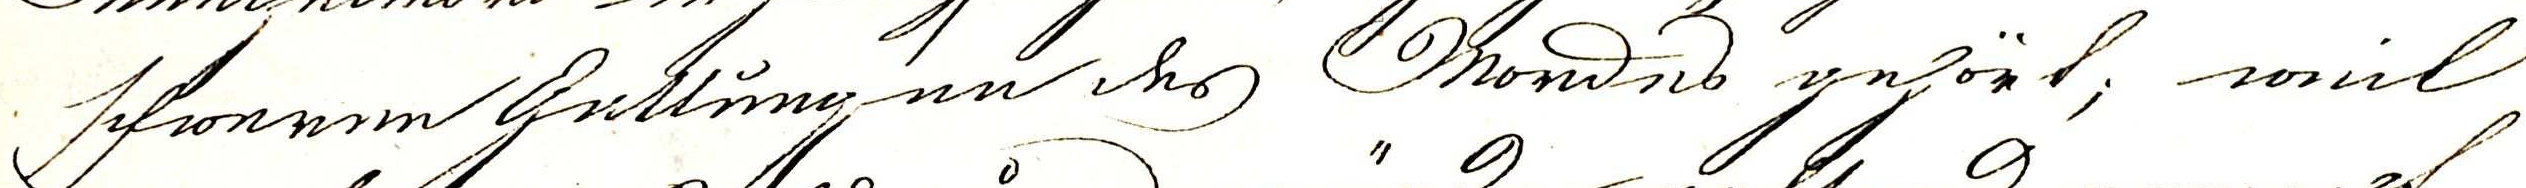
schwerem Gattung an des Mordes gehört, weil
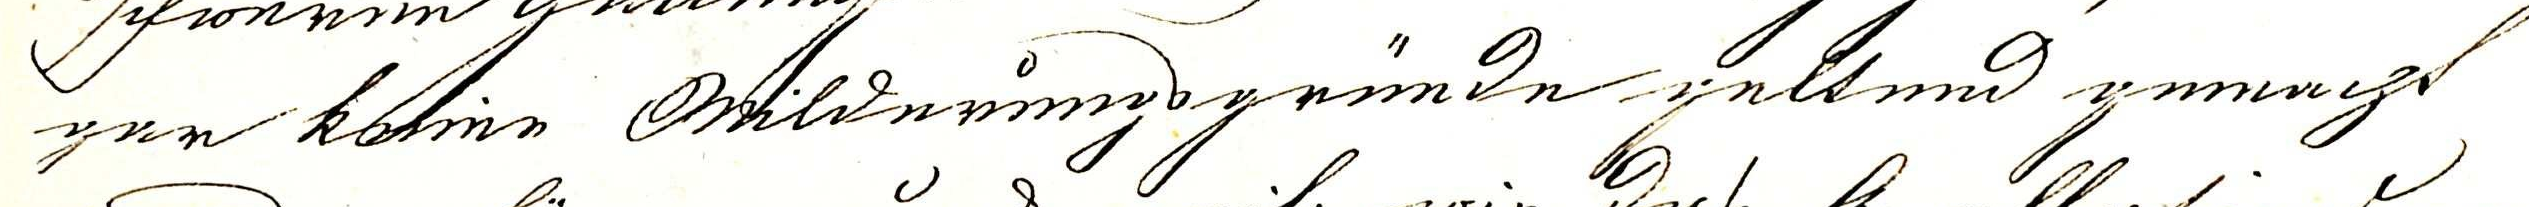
gar keine Milderungsgründe geltend gemacht
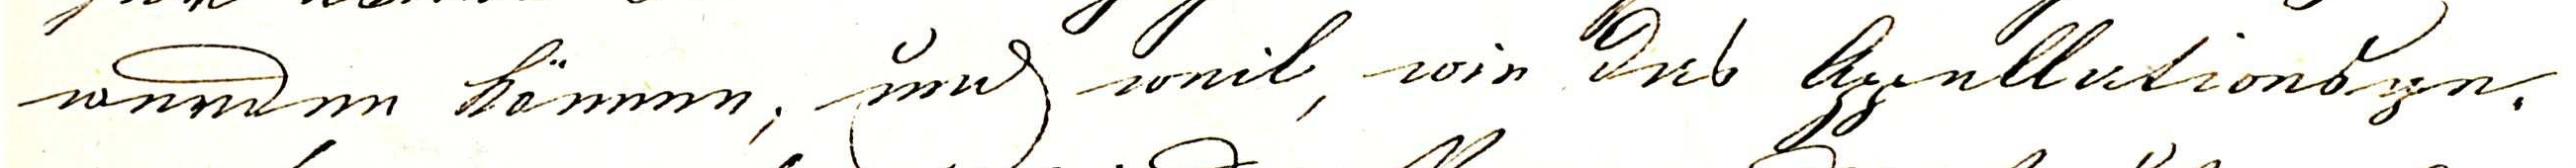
werden könne, und weil, wie das Appellationsge¬
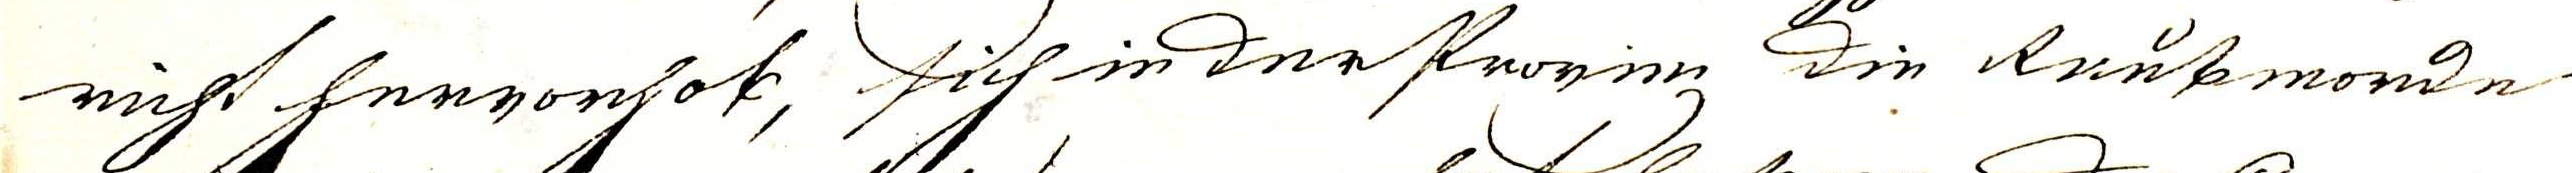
richt hervorhob, sich in der Provinz die Raubmorde
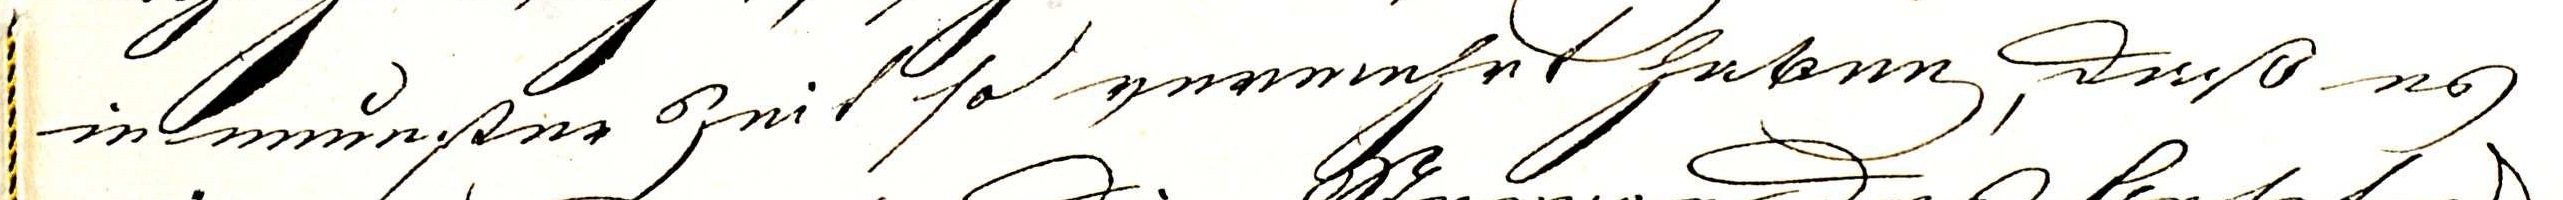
in neuester Zeit so vermehrt haben, daß es
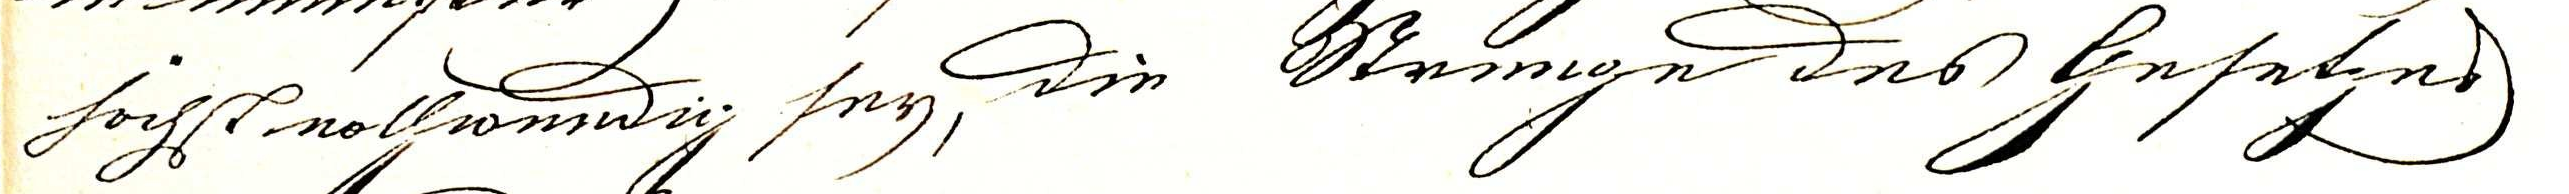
höchst nothwendig sey, die Strenge des Gesetzes
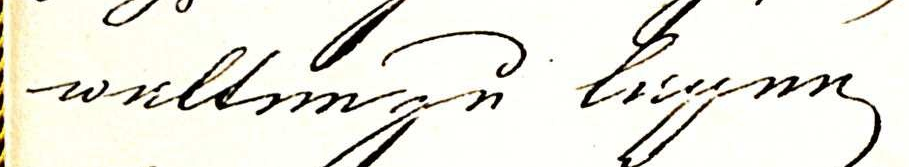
walten zu lassen.
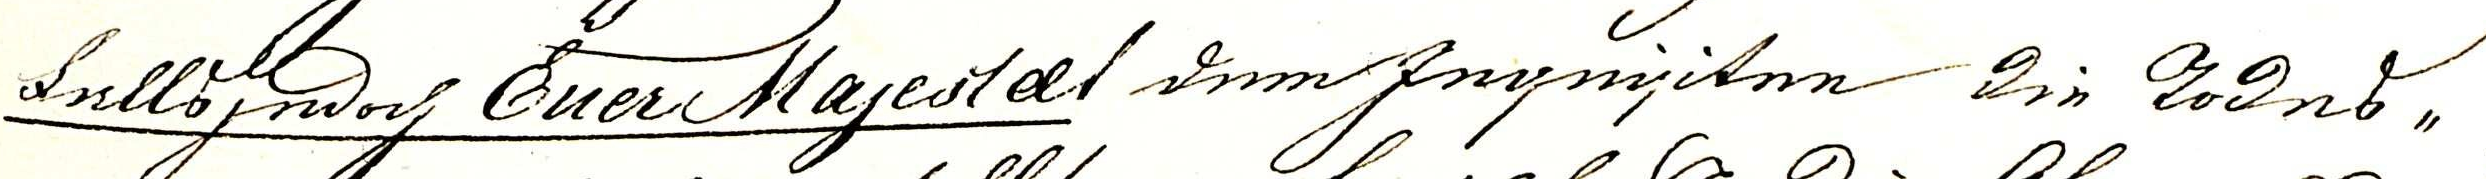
Falls jedoch Euer Majestaet dem Inquisiten die Todes¬
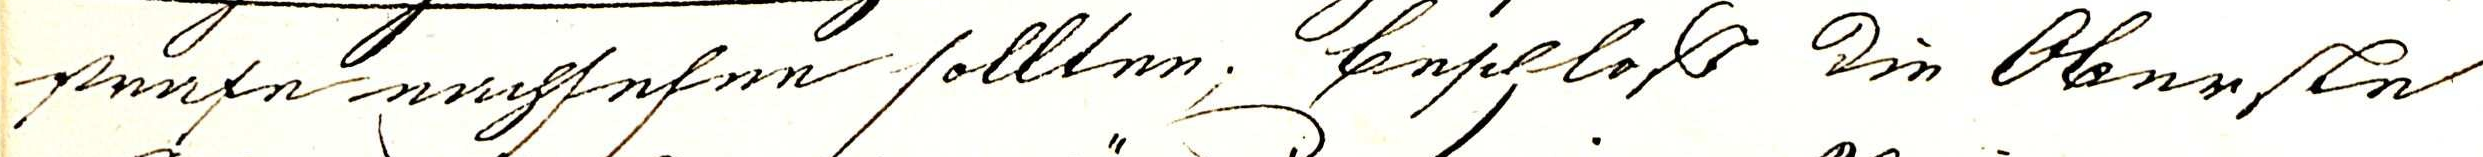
strafe nachsehen sollten; beschloß die Oberste
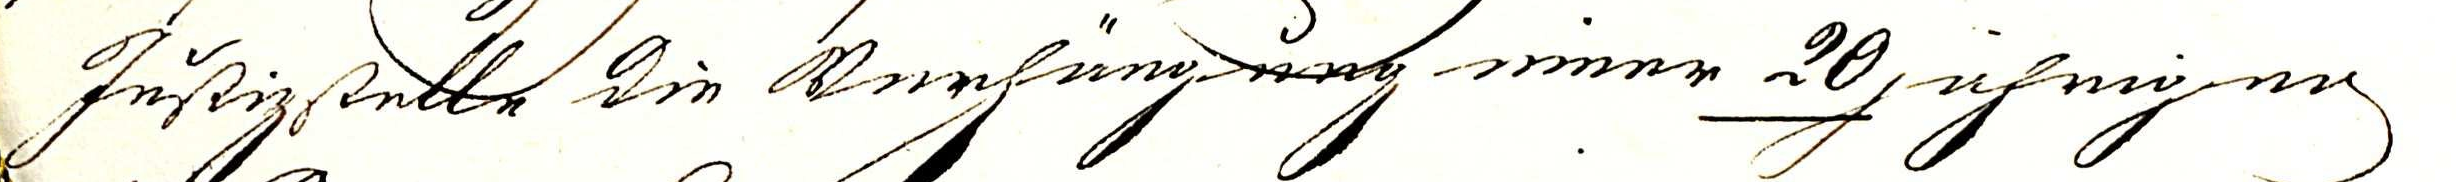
Justizstelle die Verhängung einer 20jährigen
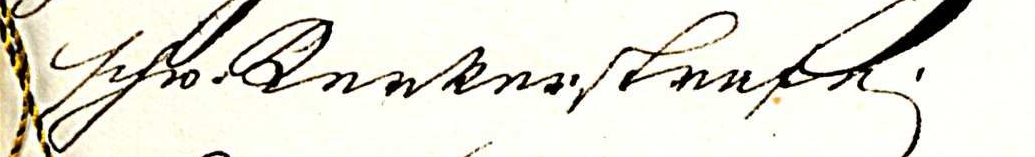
schw. Kerkerstrafe.
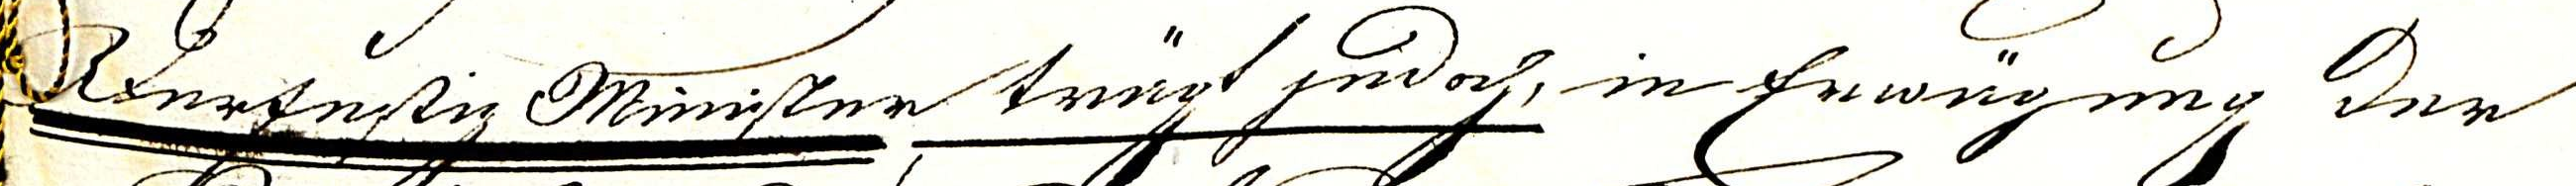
Der Justiz Minister trägt jedoch, in Erwägung der
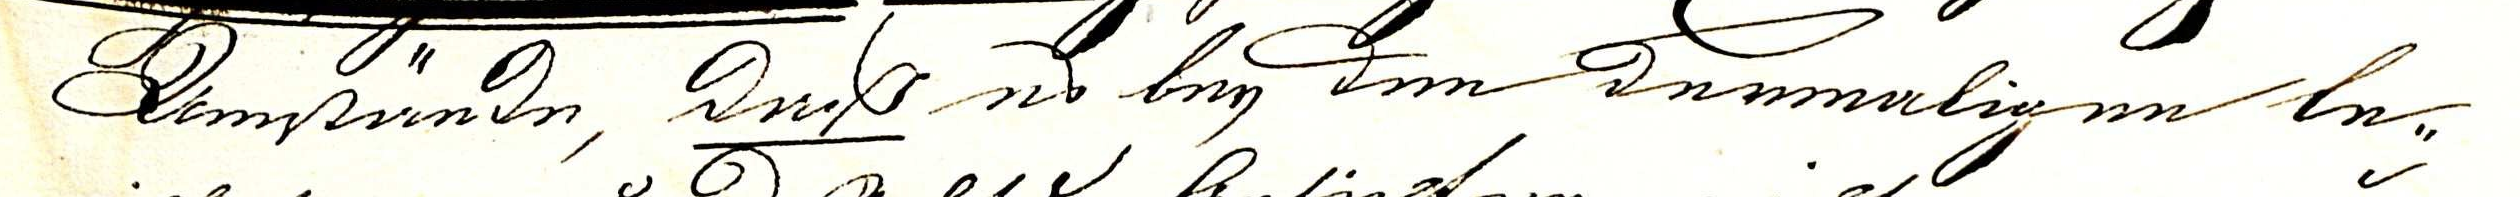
Umstände, daß es bey dem dermaligen le¬
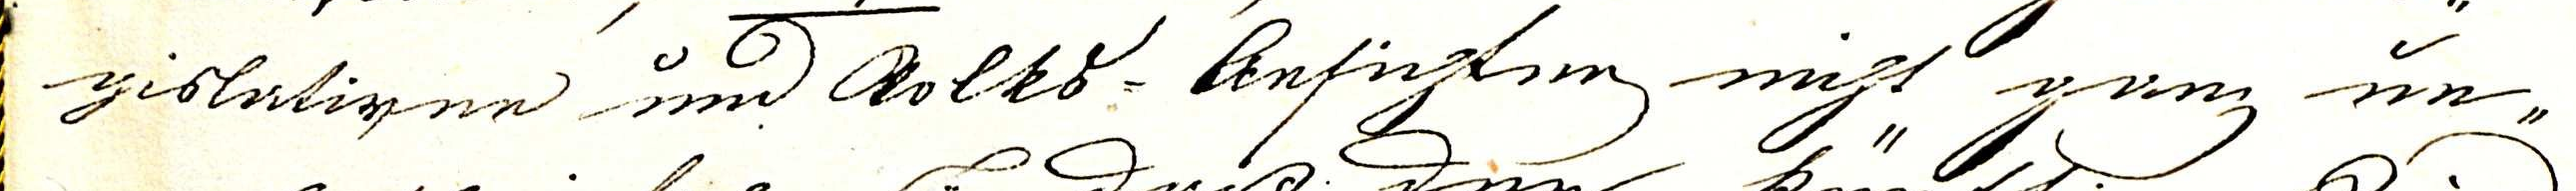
gislativer und Volks-Ansichten nicht ganz un¬
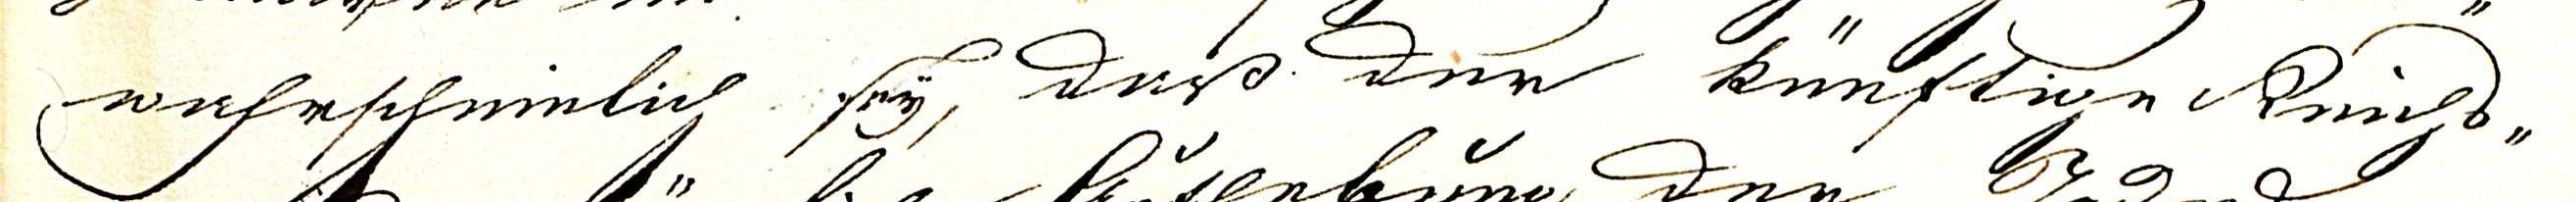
wahrscheinlich sey, daß der künftige Reichs¬
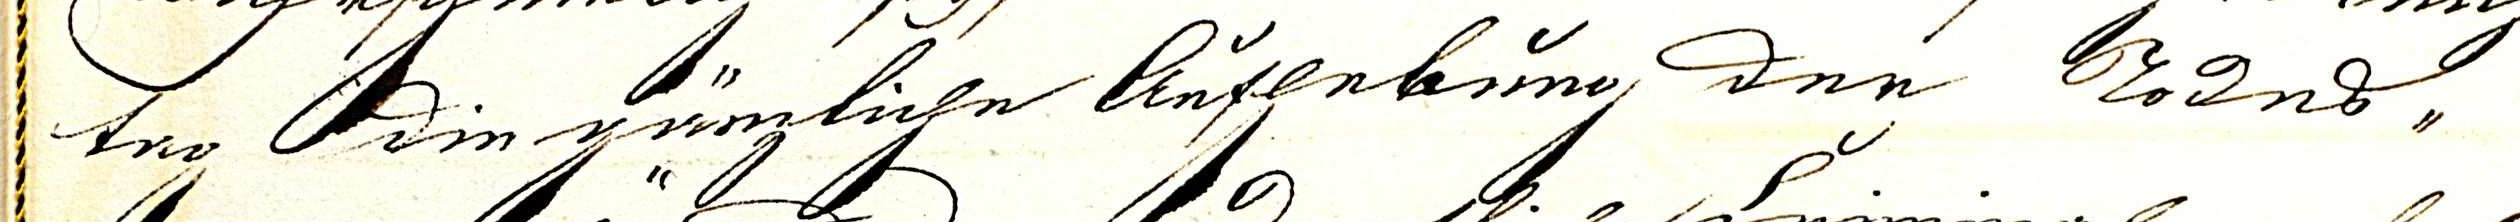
tag die gänzliche Aufhebung der Todes¬
